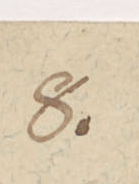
8.
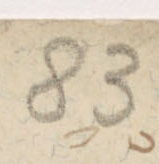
83
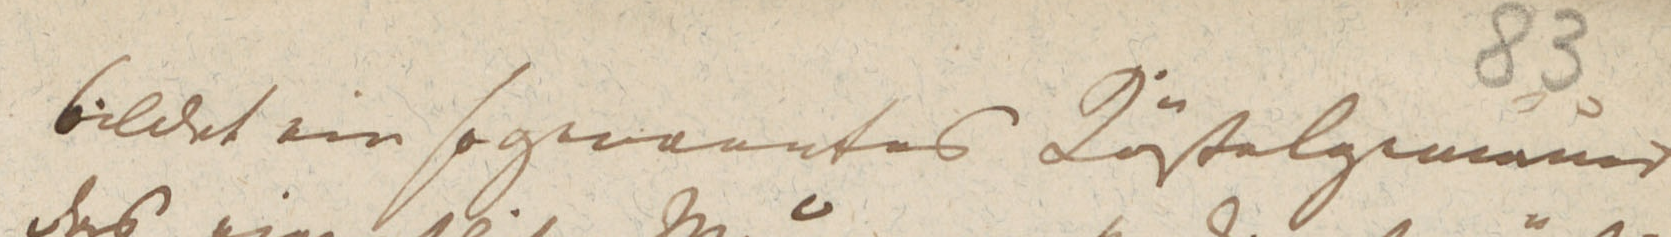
bildet ein sogenanntes Kästelgemäuer
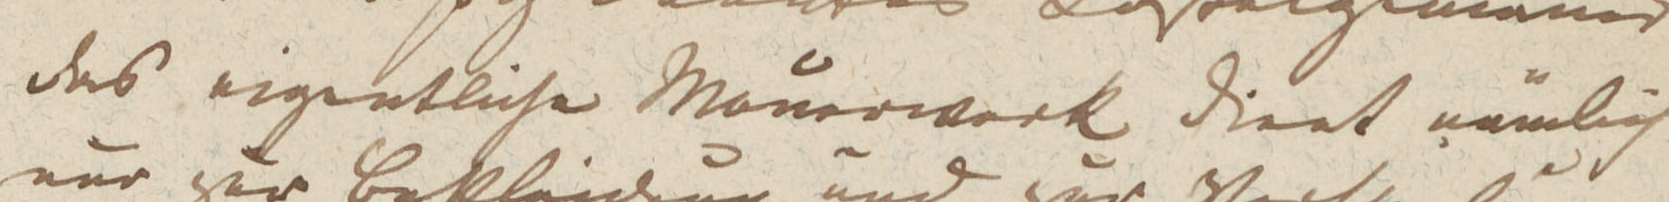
das eigentliche Mauerwerk dient nämlich
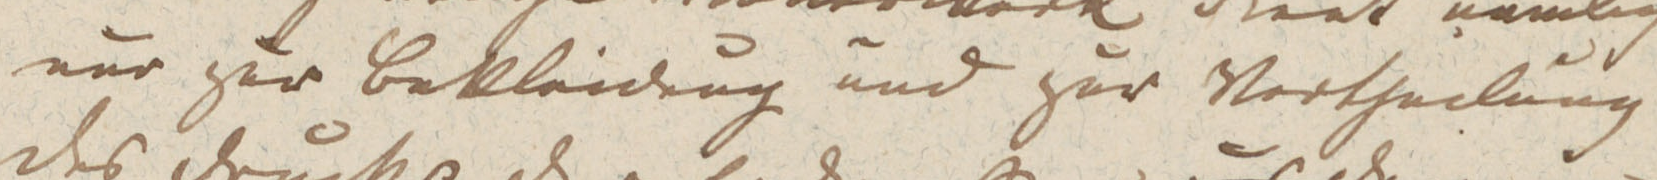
nur zur Bekleidung und zur Vertheilung
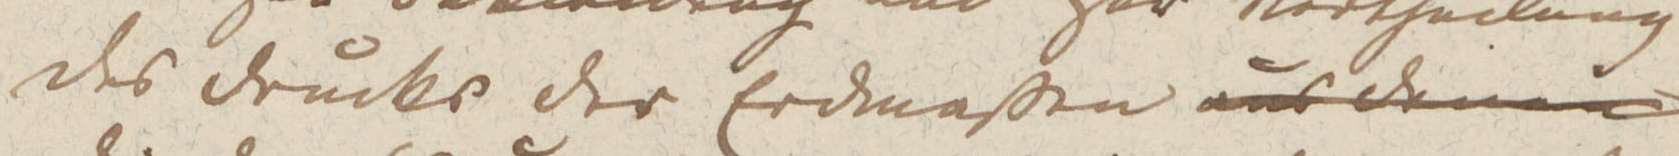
des Drucks der Erdmassen aus denen
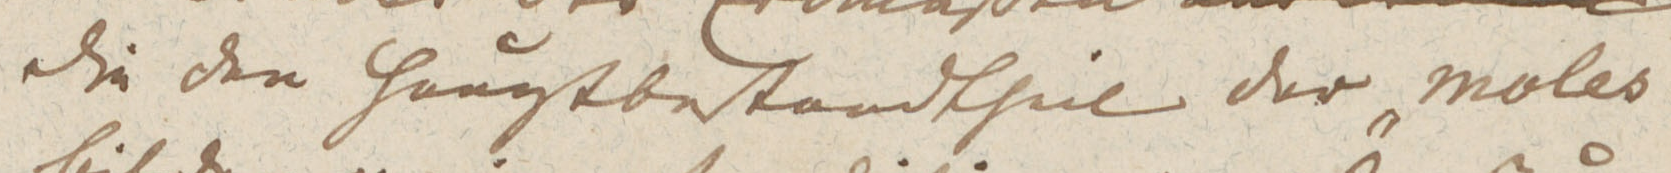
die den Hauptbestandtheil der "moles"
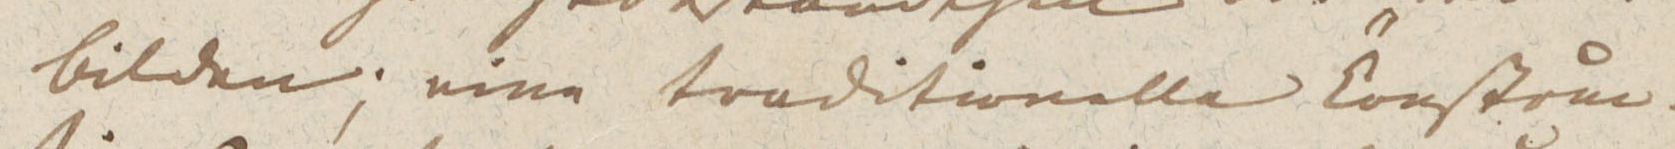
bilden; eine traditionelle Construc-
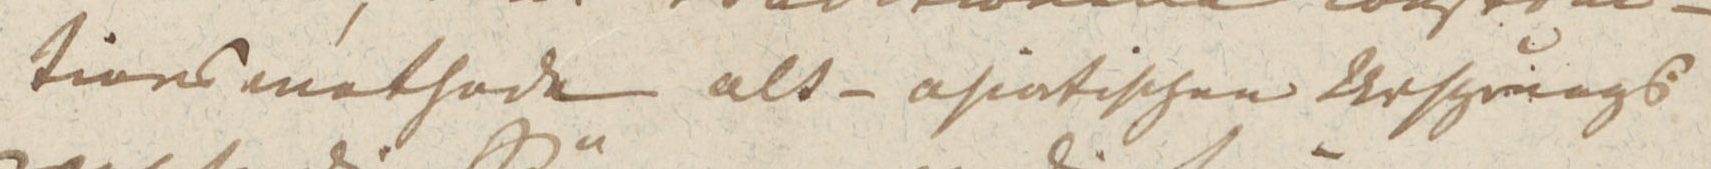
tionsmethode alt-asiatischen Ursprungs
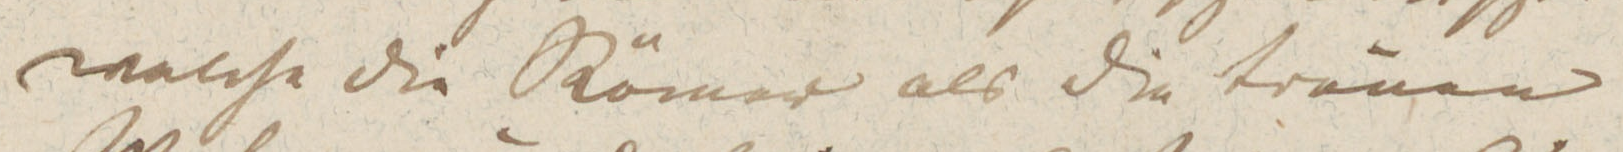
welche die Römer als die treuen
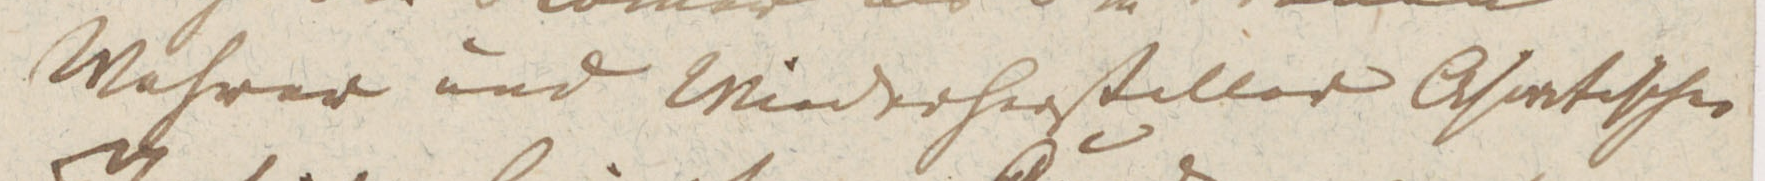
Wahrer und Wiederhersteller Asiatischer
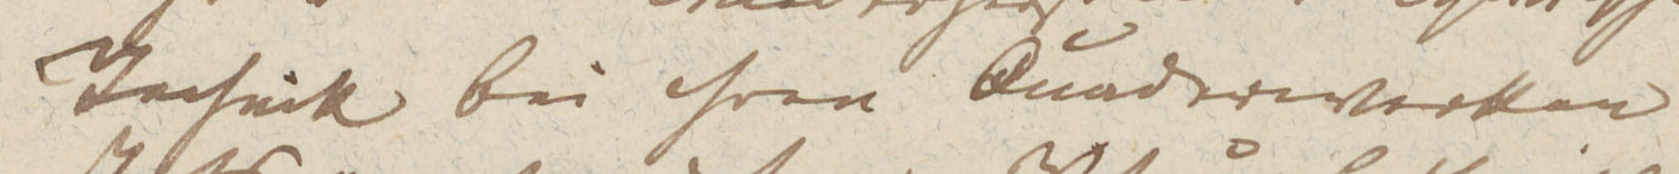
Technik bei ihren Quaderwerken
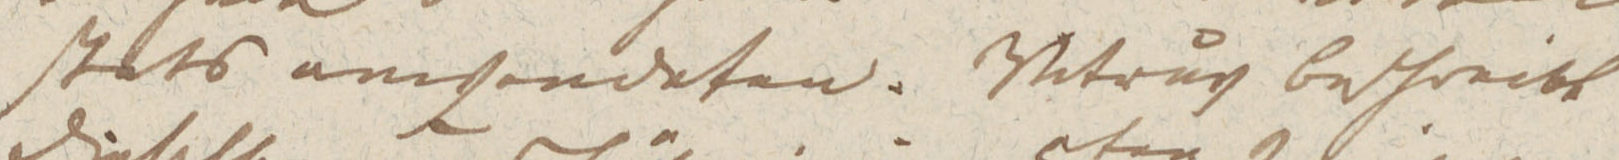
stets anwendeten. Vitruv beschreibt
